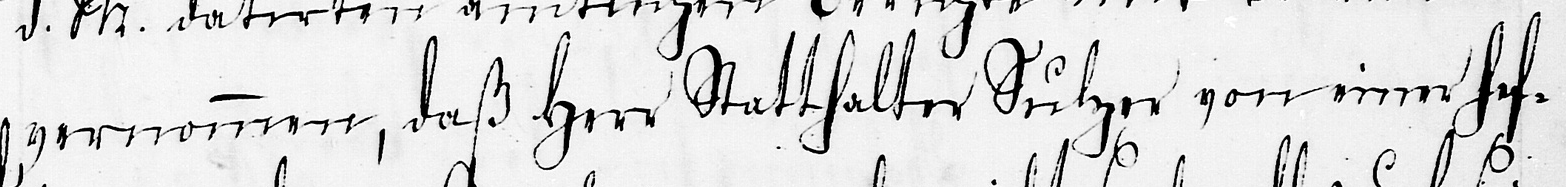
vernommen, daß Herr Statthalter Sulzer von einer hef¬
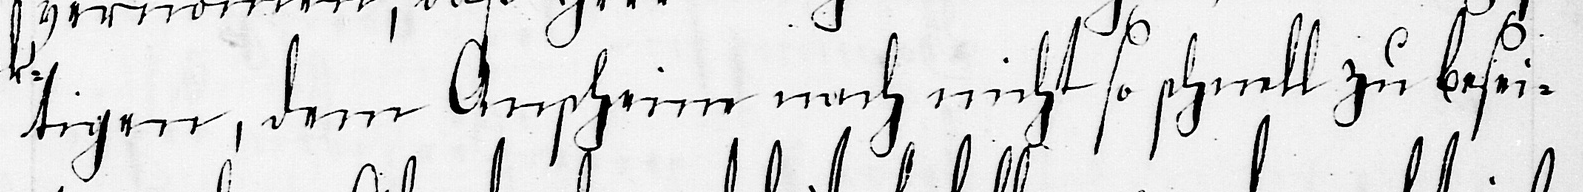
tigen, dem Anscheine nach nicht so schnell zu besei¬
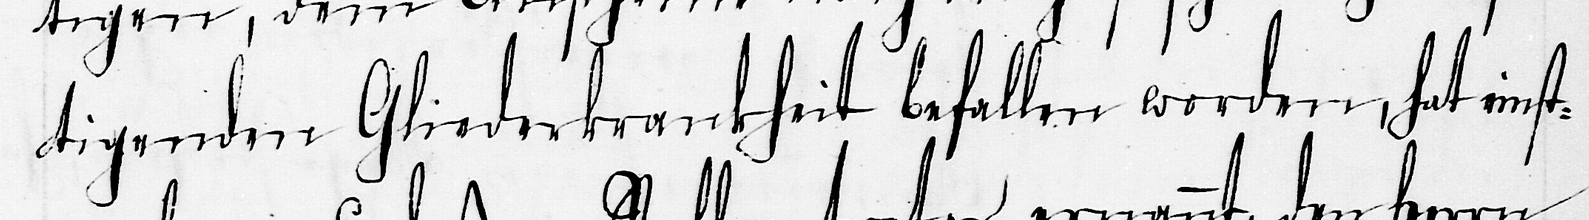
tigenden Gliederkrankheit befallen worden, hat einst¬
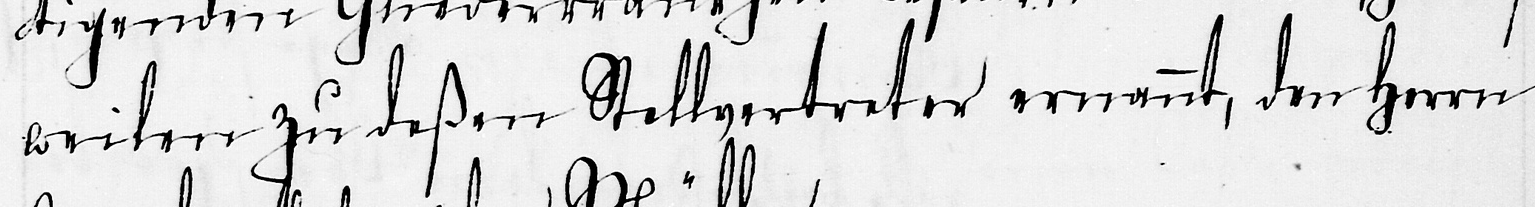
weilen zu deßen Stellvertreter ernannt, den Herrn
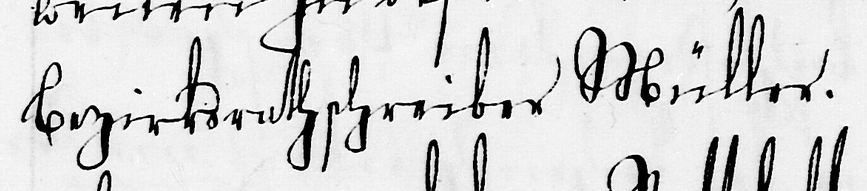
Bezirksrathschreiber Müller.
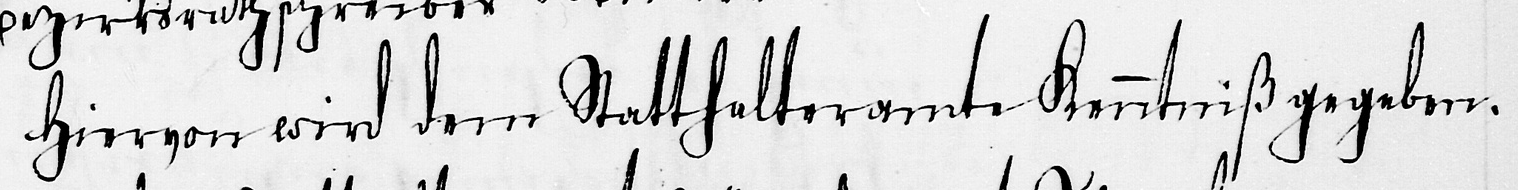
Hiervon wird dem Statthalteramte Kenntniß gegeben.
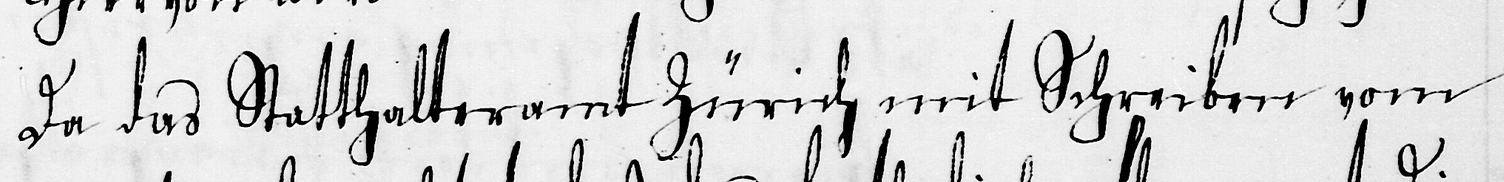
Da das Statthalteramt Zürich mit Schreiben vom
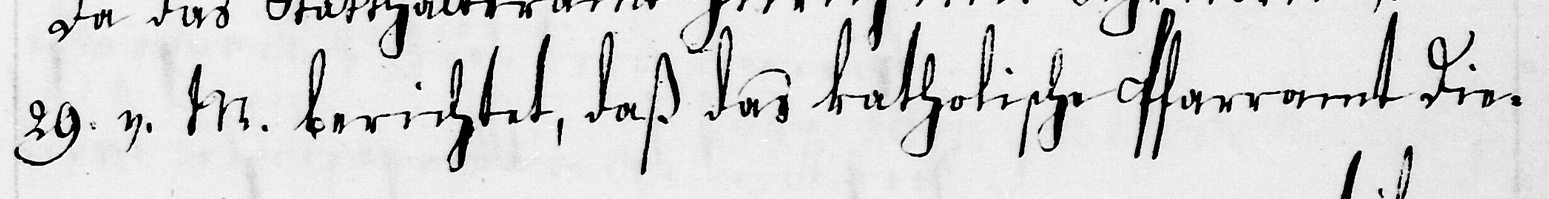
29. v. M. berichtet, daß das katholische Pfarramt Die-
